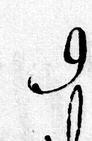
le
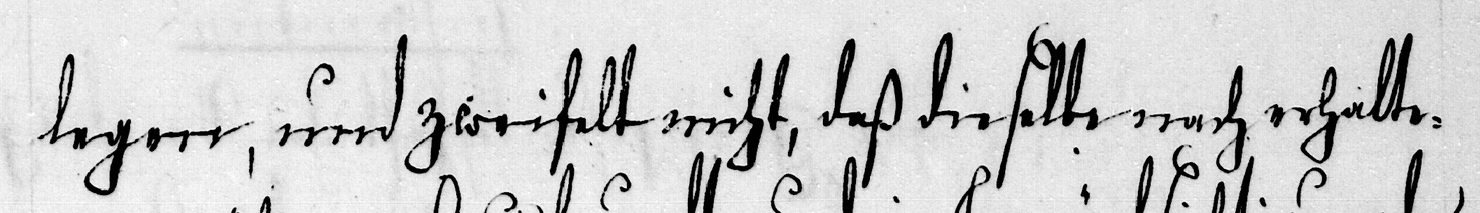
legen, und zweifelt nicht, daß dieselbe nach erhalte¬
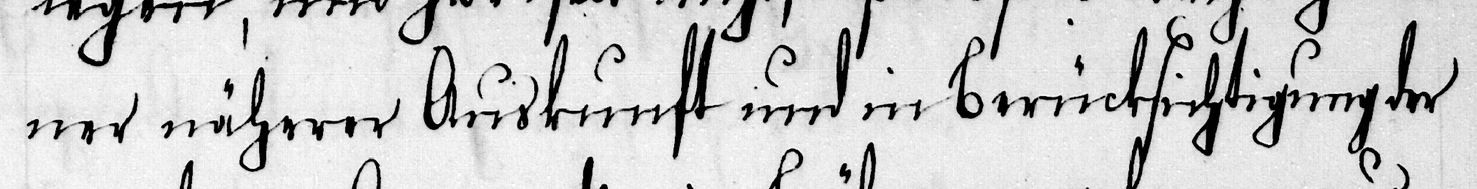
ner näherer Auskunft und in Berücksichtigung der
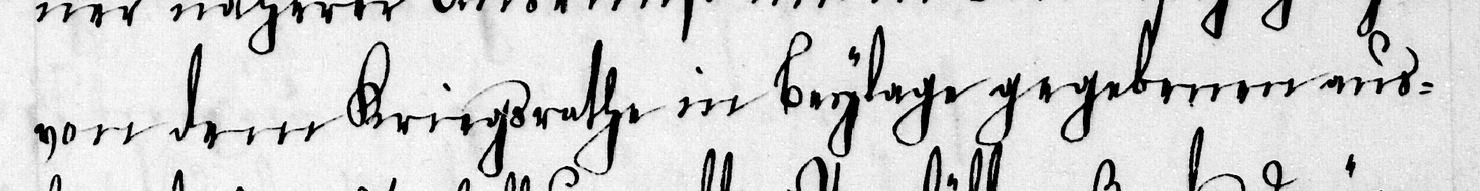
von dem Kriegsrathe in Beylage gegebenen aus¬
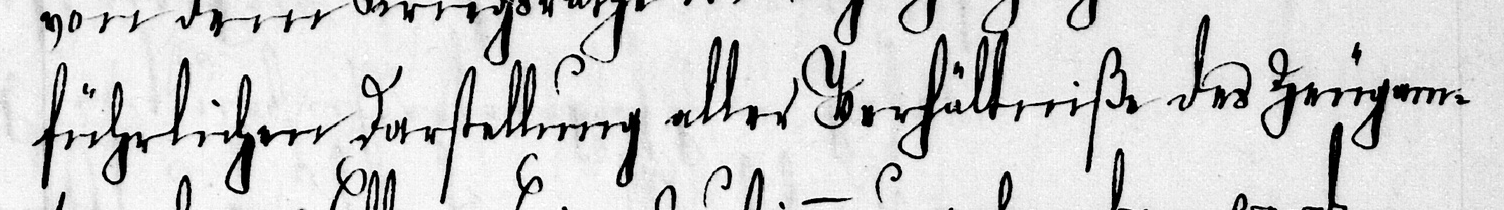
führlichen Darstellung aller Verhältniße des Zeugam¬
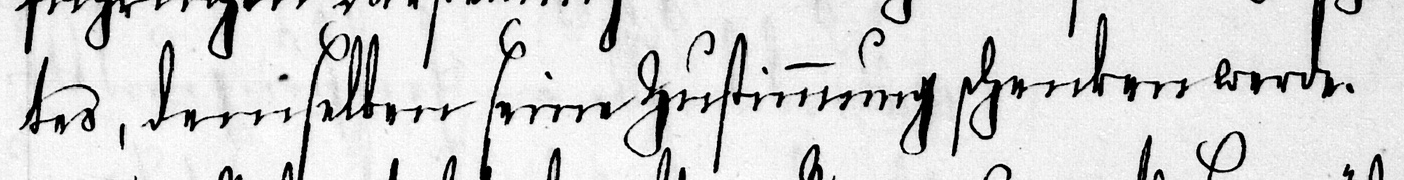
tes, demselben seine Zustimmung schenken werde.
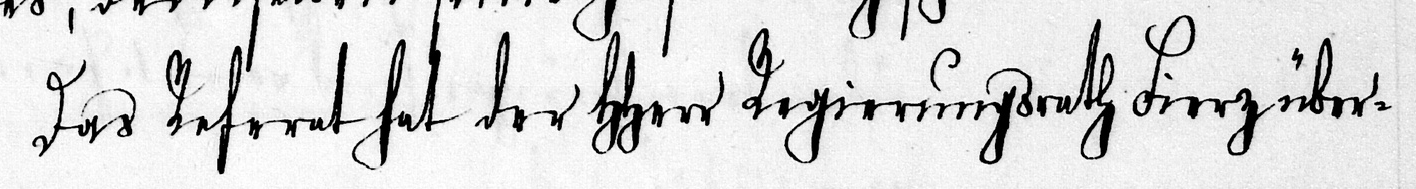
Das Referat hat der HHerr Regierungsrath Fierz über¬
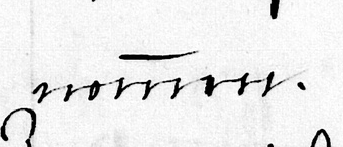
nommen.
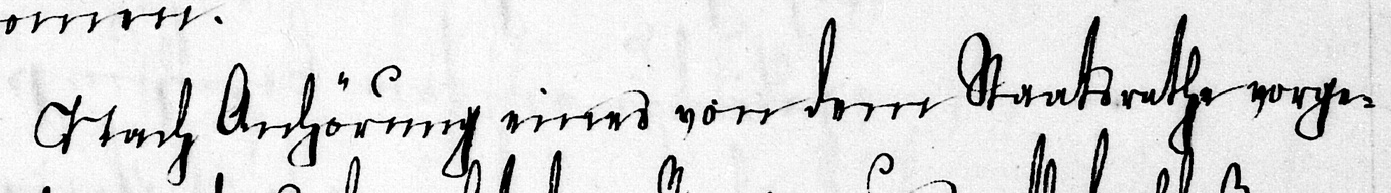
Nach Anhörung eines von dem Staatsrathe vorge¬
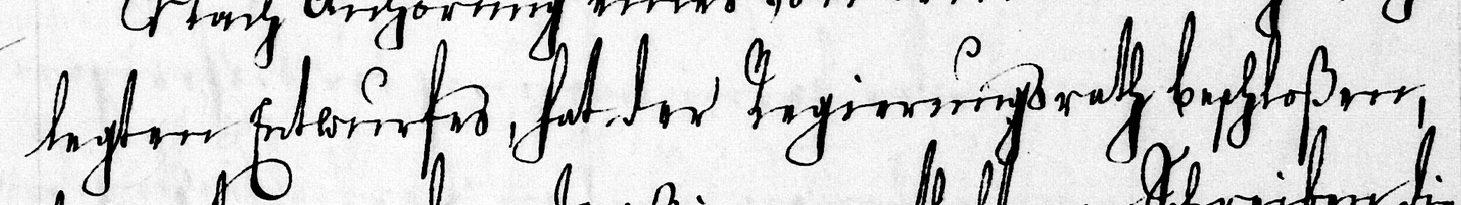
legten Entwurfes, hat der Regierungsrath beschloßen,
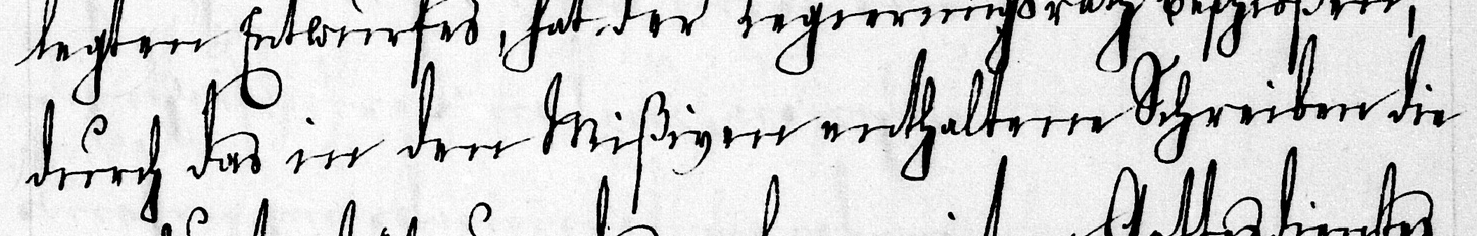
durch das in den Mißiven enthaltene Schreiben die
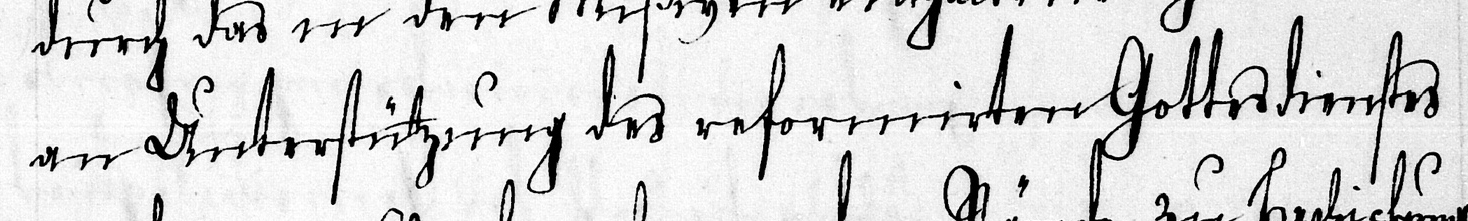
an Unterstützung des reformirten Gottesdienstes
